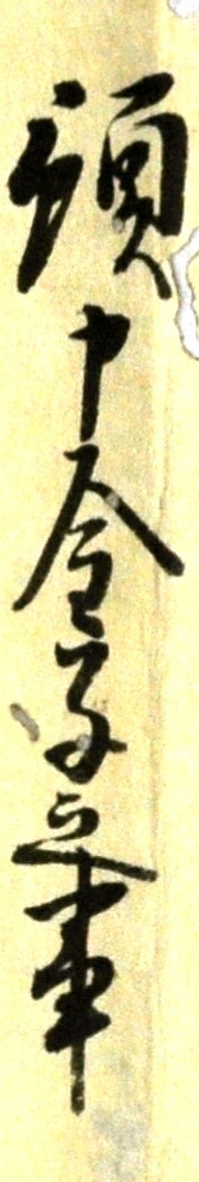預申金子之事
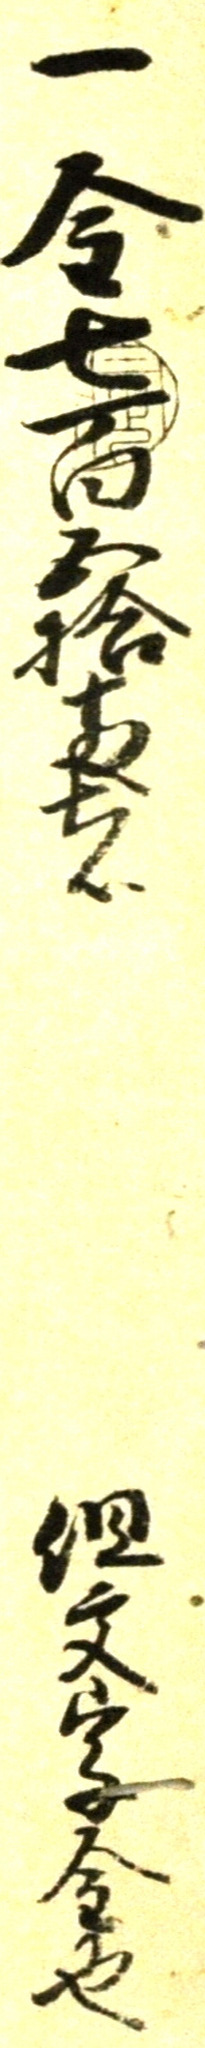一金七百五拾両者但文字金也
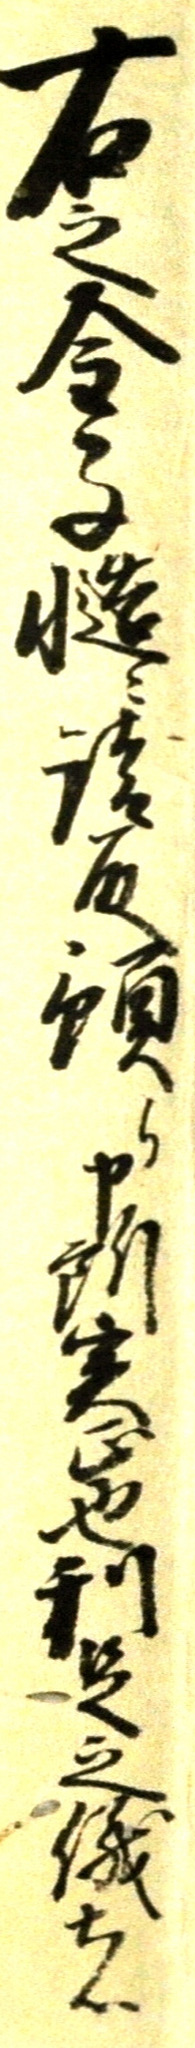右之金子慥に請取預り申所実証也利足之儀は
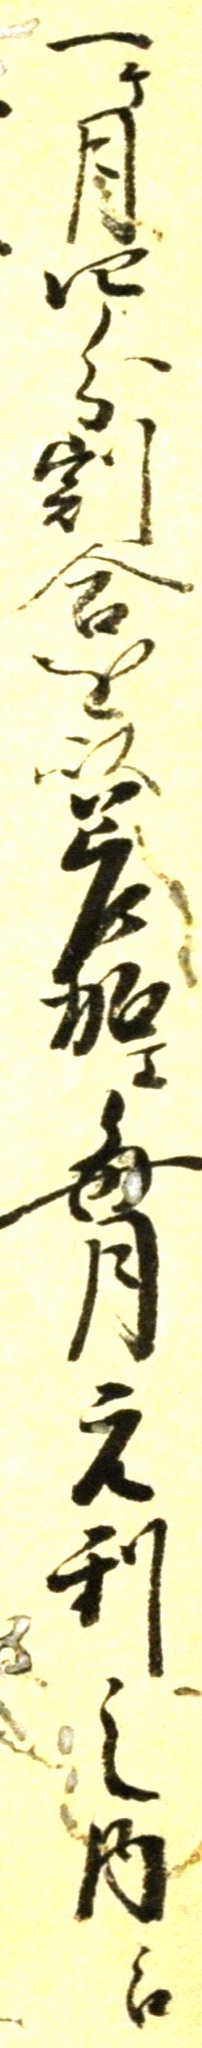一ヶ月四分割合を以差加え毎月元利之内え
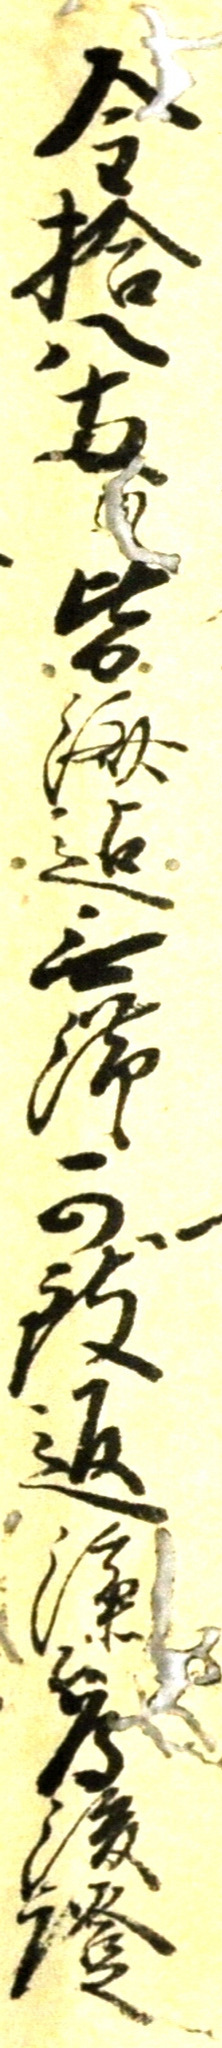金拾八両ツヽ皆済迄無滞可致返済候為後証
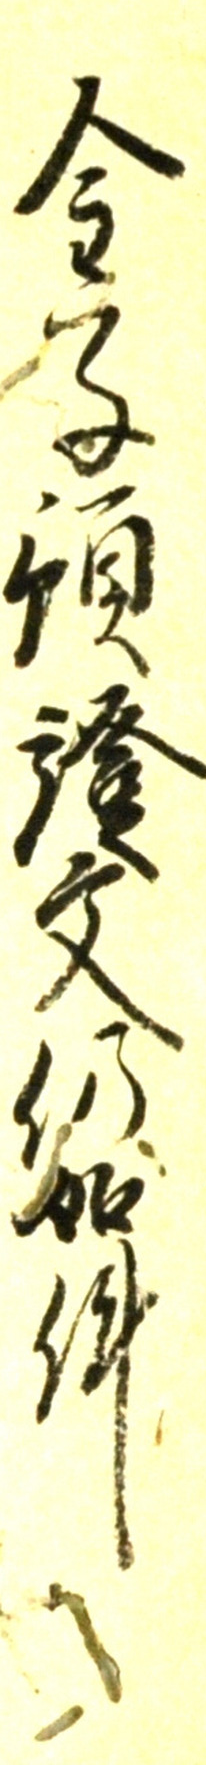金子預証文仍如件
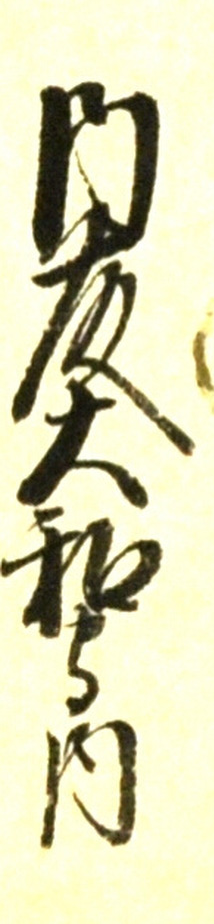内藤大和守内
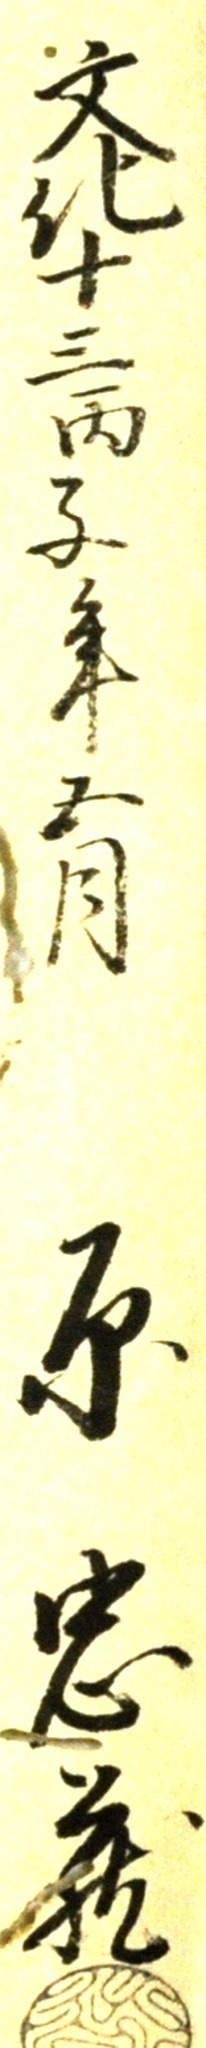文化十三丙子年五月原忠蔵㊞
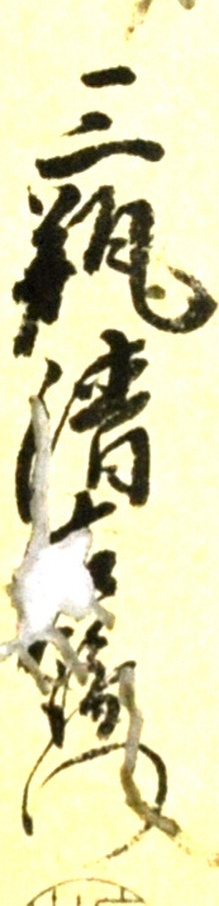三瓶清左衛門㊞
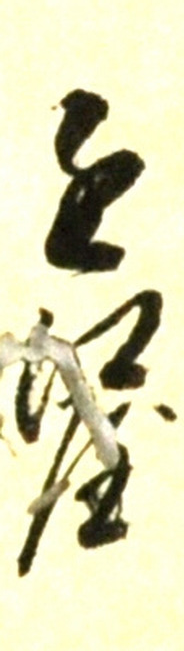近江屋
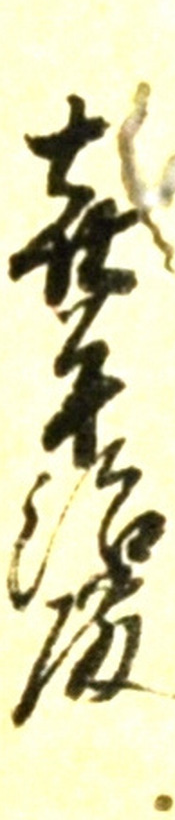喜平治殿
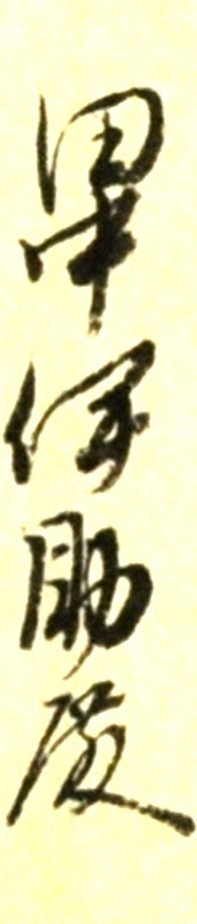田中伊助殿
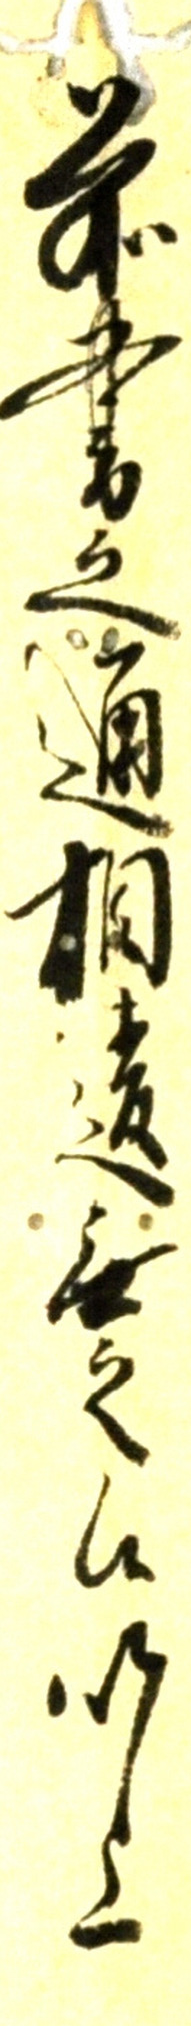前書之通相違無之候以上

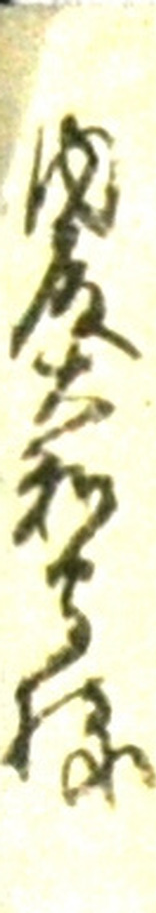内藤大和守様
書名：預り申金子之事
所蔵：伊那市立高遠町図書館・合同会社AMANE
